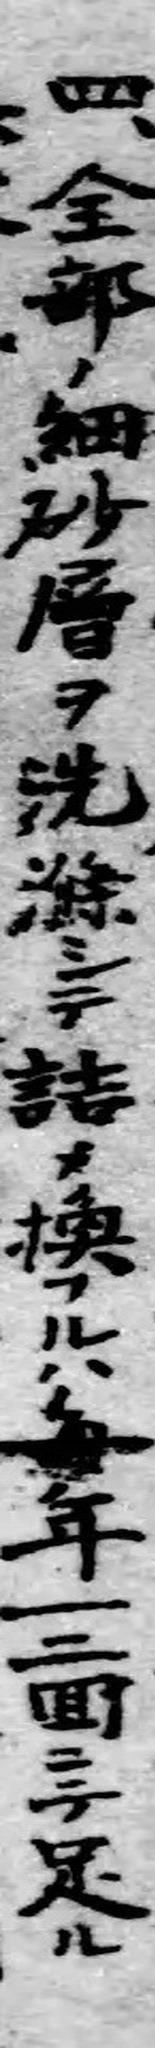四、全部ノ細砂層ヲ洗滌シテ詰メ換フルハ毎年一二回ニテ足ル

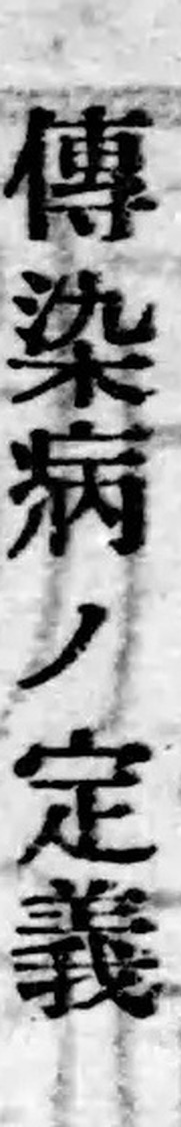傅染病ノ定義
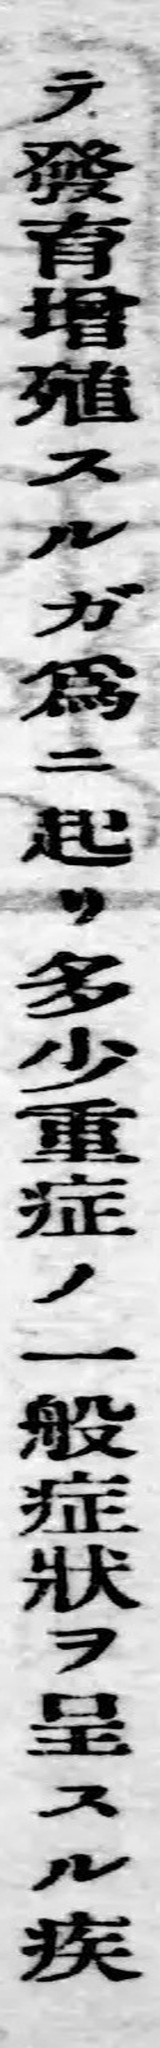テ發育增殖スルガ爲ニ起リ多少重症ノ一般症狀ヲ呈スル疾
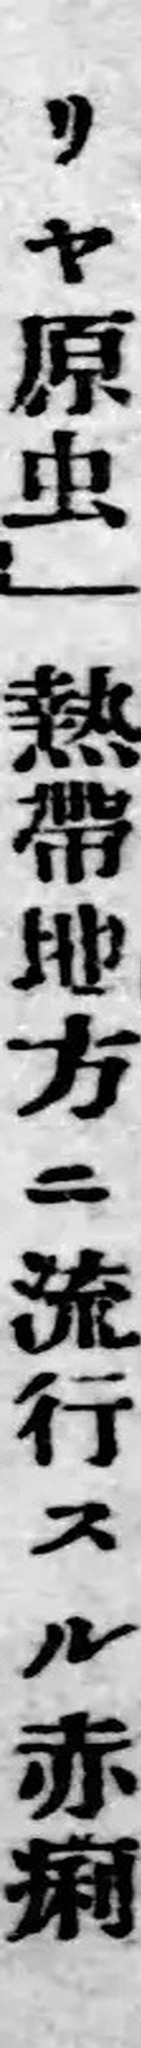リア原虫」熱帶地方ニ流行スル赤痢
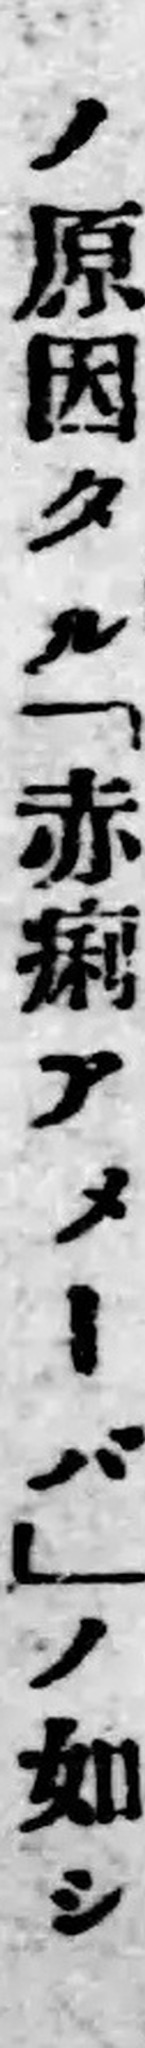ノ原因タル「赤痢アメーバ」ノ如シ

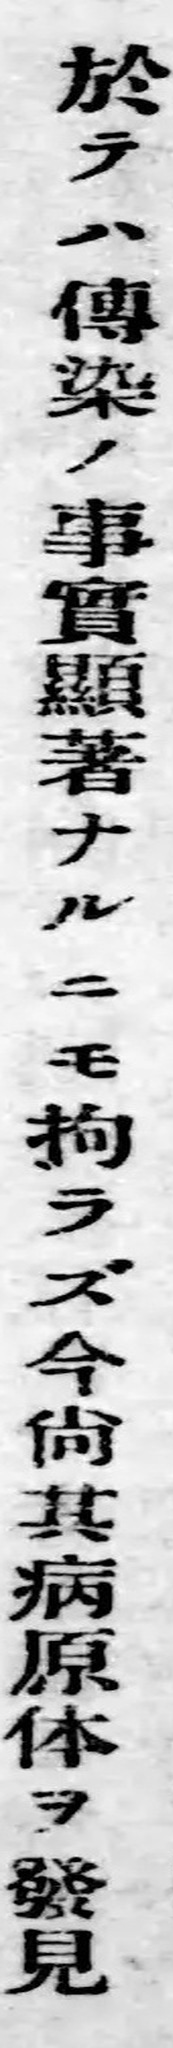於テハ傅染ノ事實顯著ナルニモ拘ラズ今尚其病原体ヲ發見
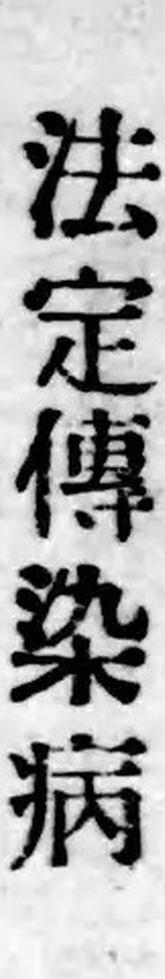法定傅染病
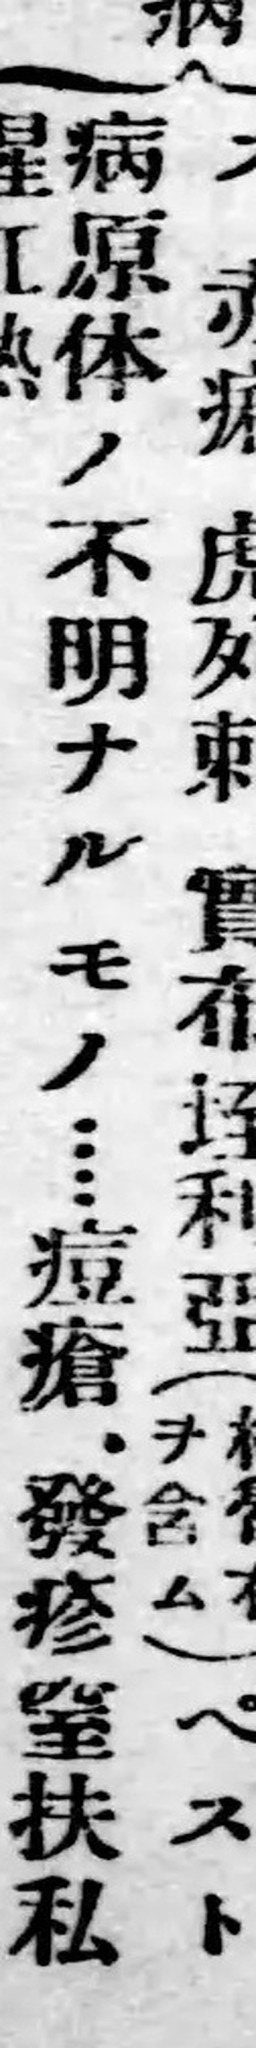病原体ノ不明ナルモノ…痘瘡、発疹窒扶私
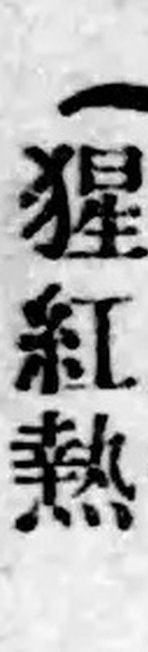猩紅熱
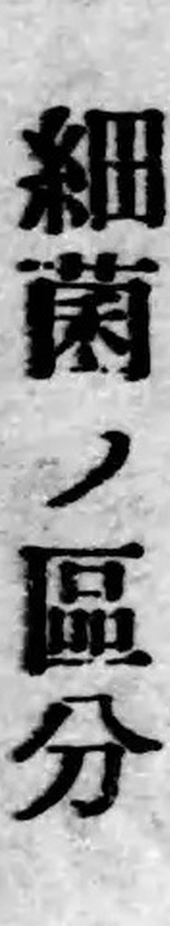細菌ノ區分
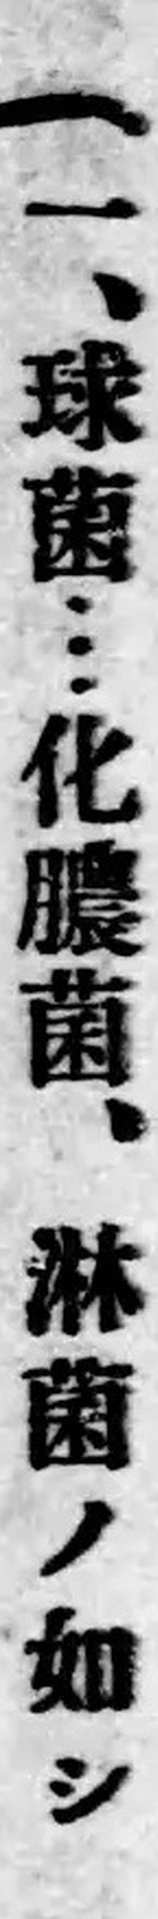細菌一、球菌…化膿菌、淋菌ノ如シ
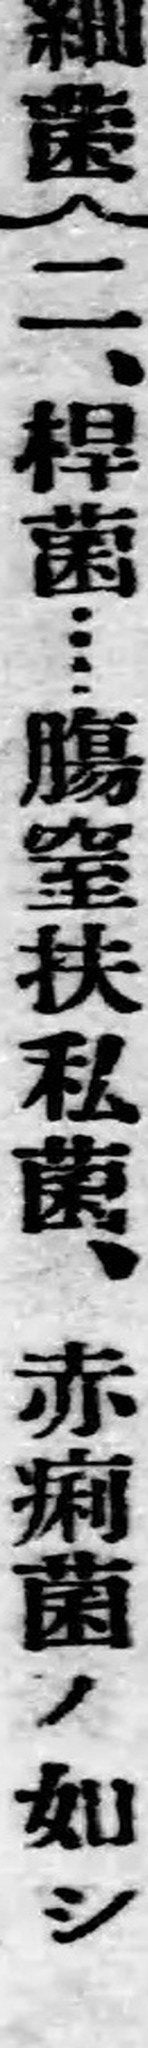二、桿菌…膓窒扶私菌、赤痢菌ノ如シ
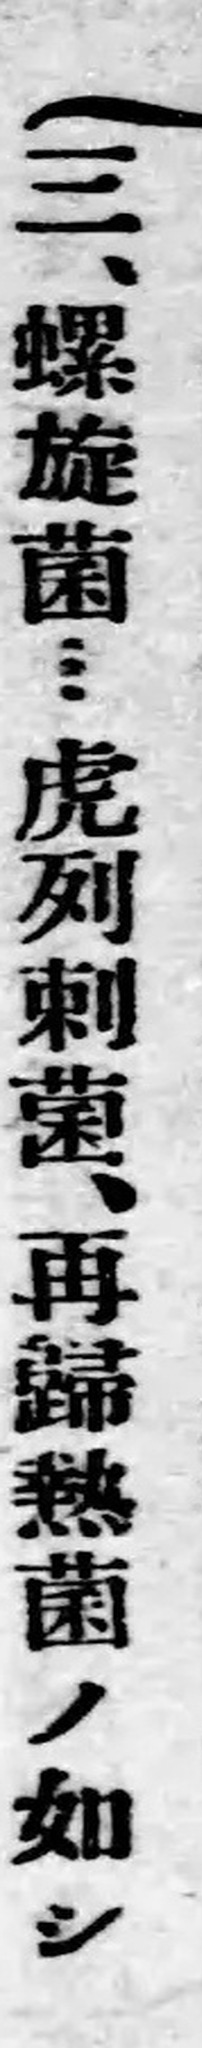三、螺旋菌…虎列刺菌、再歸熱菌ノ如シ
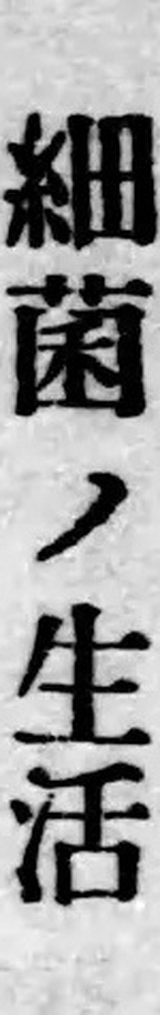細菌ノ生活
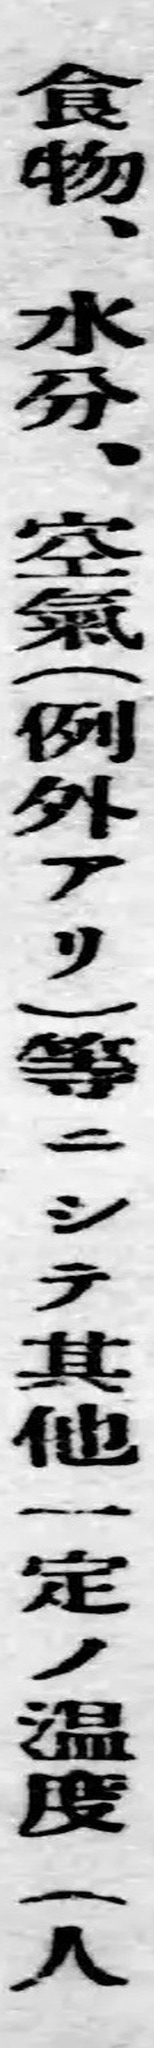食物、水分、空氣(例外アリ)等ニシテ其他一定ノ温度(人
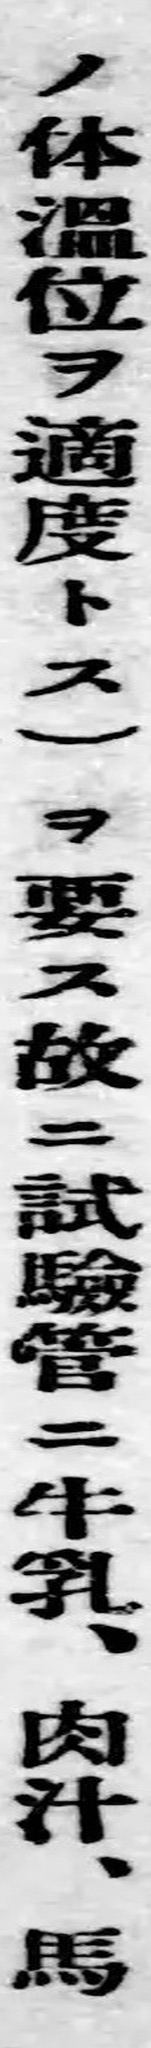ノ体溫位ヲ適度トス)ヲ要ス故ニ試験管ニ牛乳、肉汁、馬
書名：袖珍防疫必携
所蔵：国立国会図書館 National Diet Library, JAPAN
